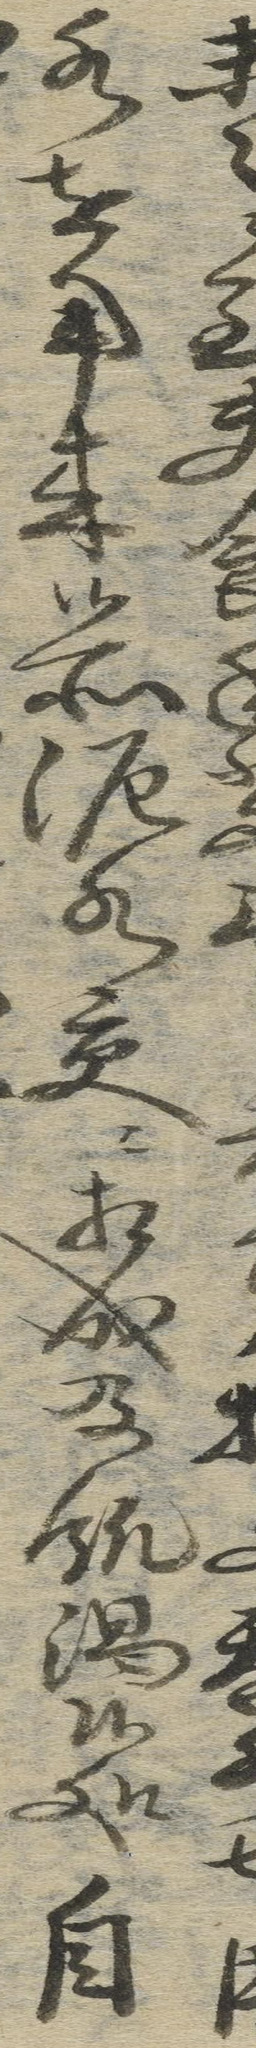水を用来候所泥水交二相成及飢渇候処自
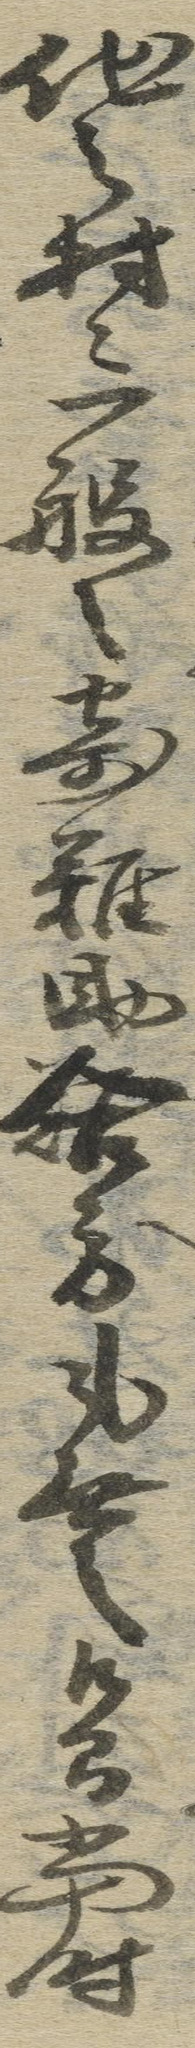他之村々一般之奇難助合方も無之候間当時
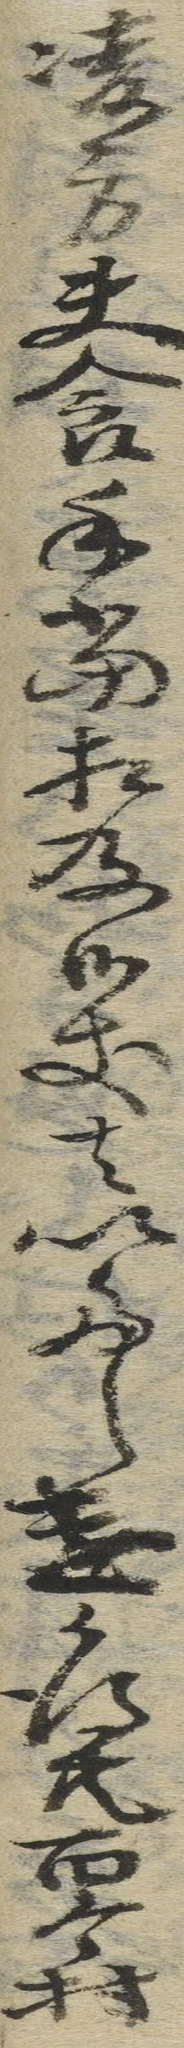凌方夫食之手当相及候丈はいたし遣候得共百ヶ村
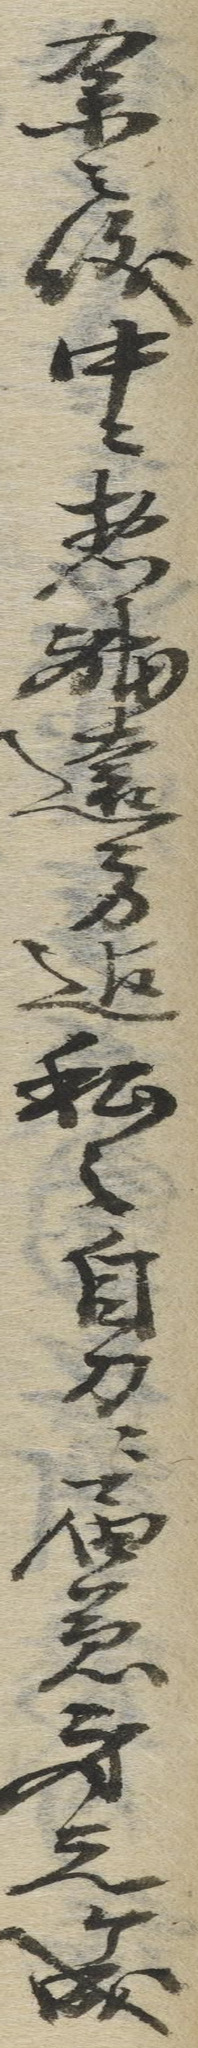余之儀中々惣躰遠方迄私之自力二届兼身元ヶ成
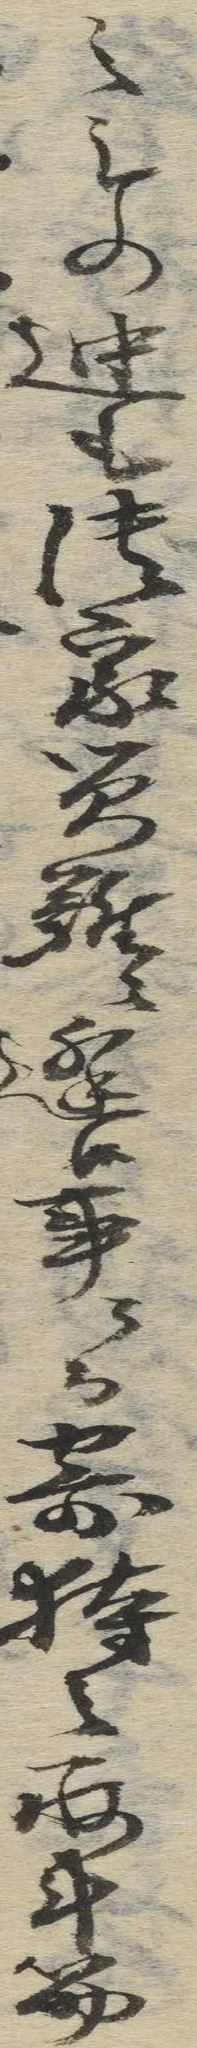之もの迚も潰家災難二逢候事二而奇特之取計筋
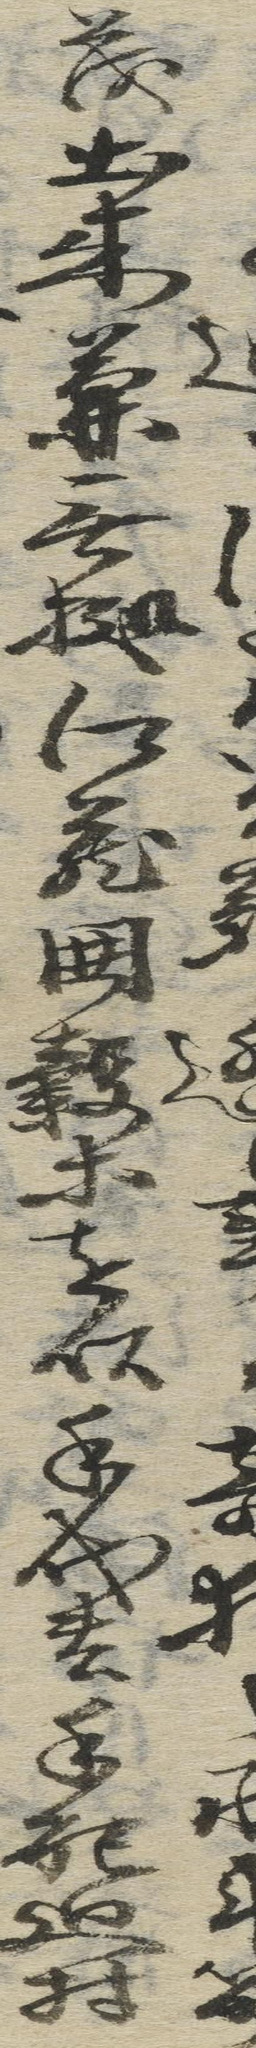も出来兼無拠郷倉囲穀等を以手代共手配廻村
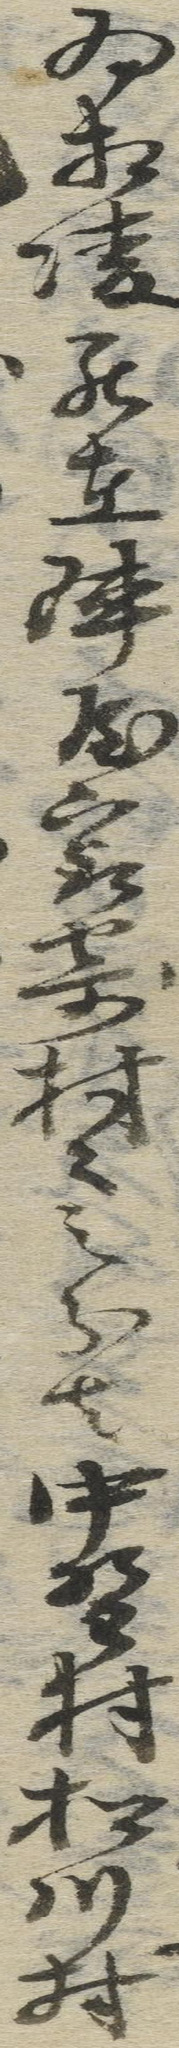為相凌罷在陣屋最寄村々之分は中野村松川村
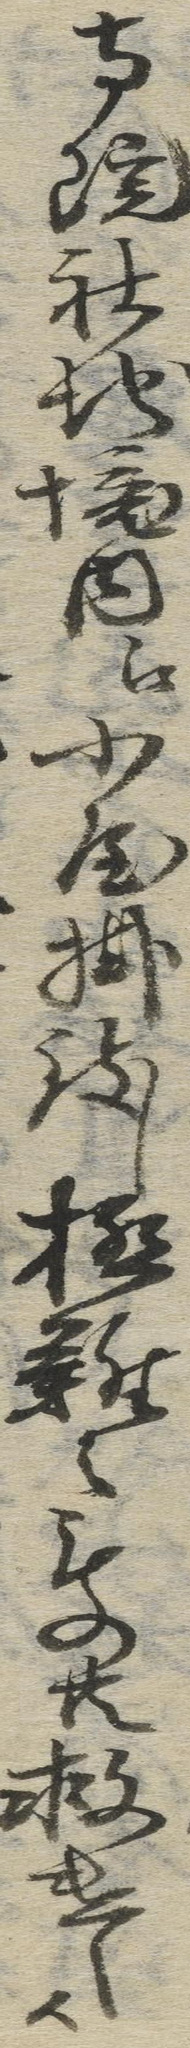寺院社地境内江小屋掛致し極難之もの共救遣し候
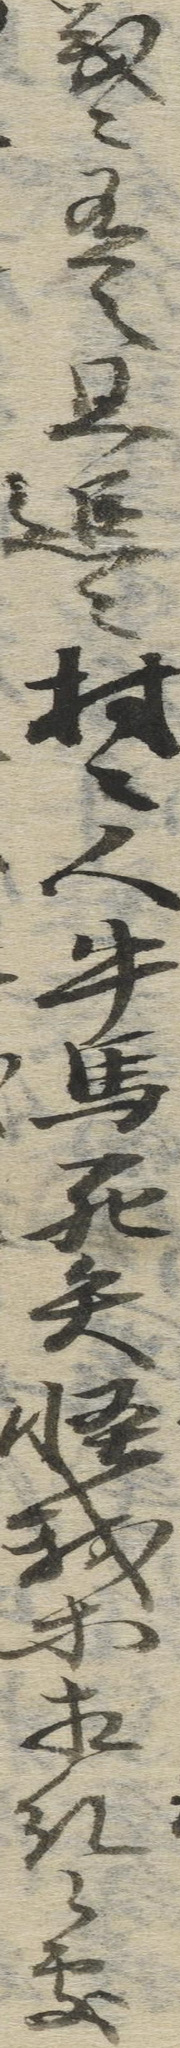義二有之且追々村々人牛馬死失怪我等相糺候処
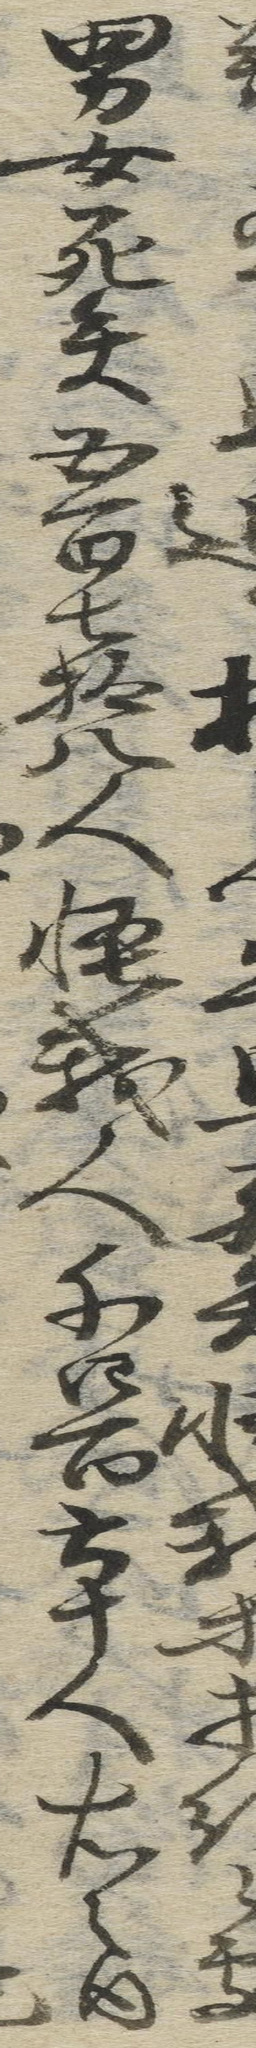男女死失五百七拾八人怪我人千四百六拾人右之内
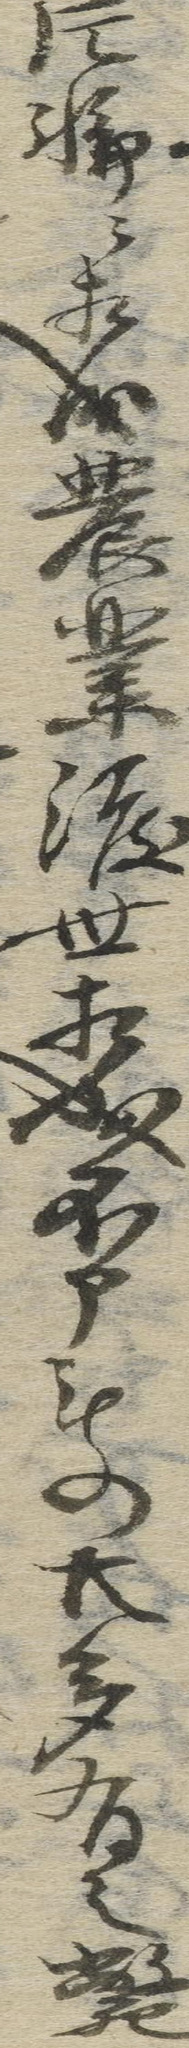片輪二相成農業渡世相成不申もの共多有之斃
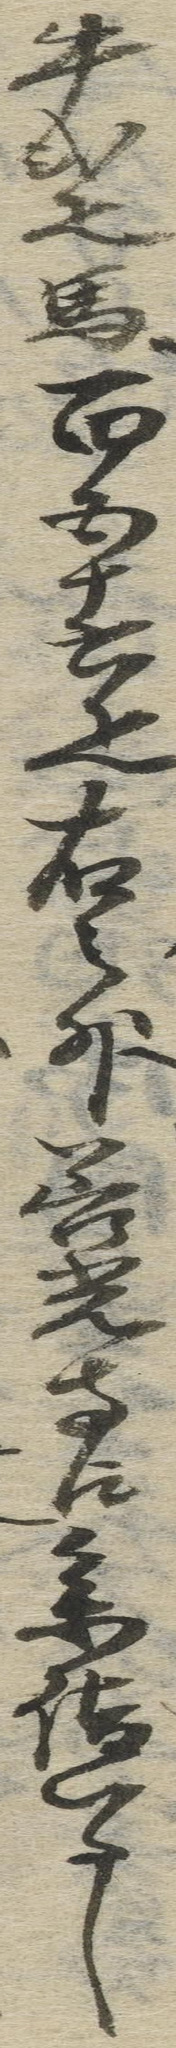牛弐疋馬百五十六疋右之外善光寺江参詣いたし
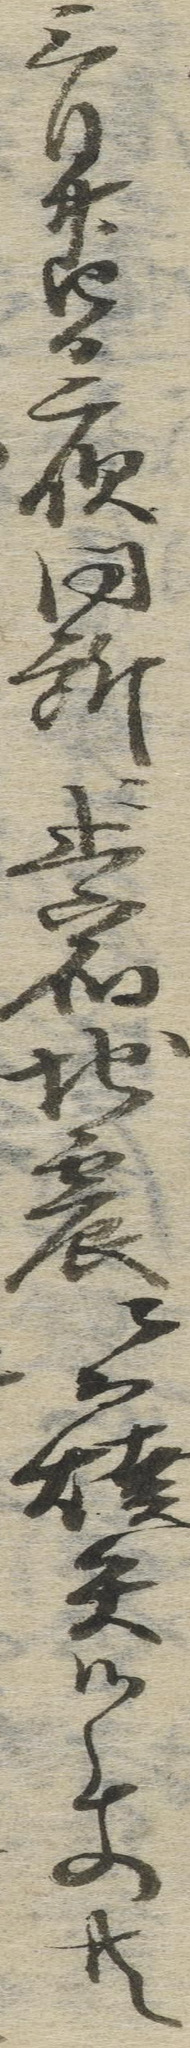三月廿四日夜同所二止宿地震二而焼失候もの共
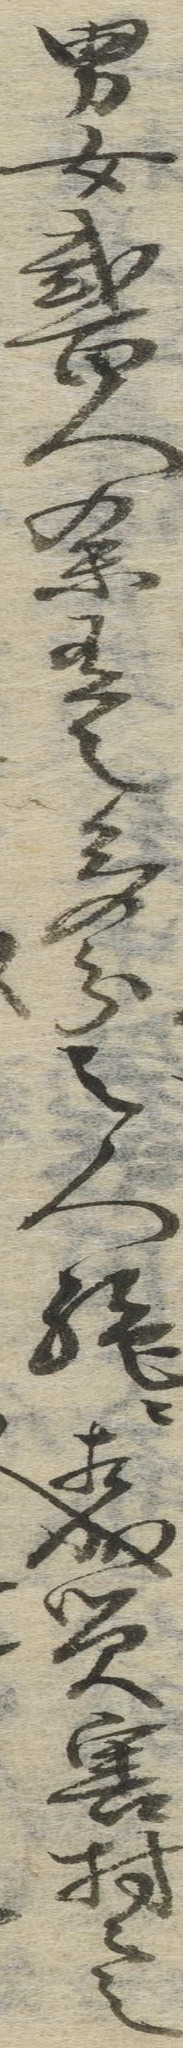男女弐百人余有之多分之人絶二相成災害村々之
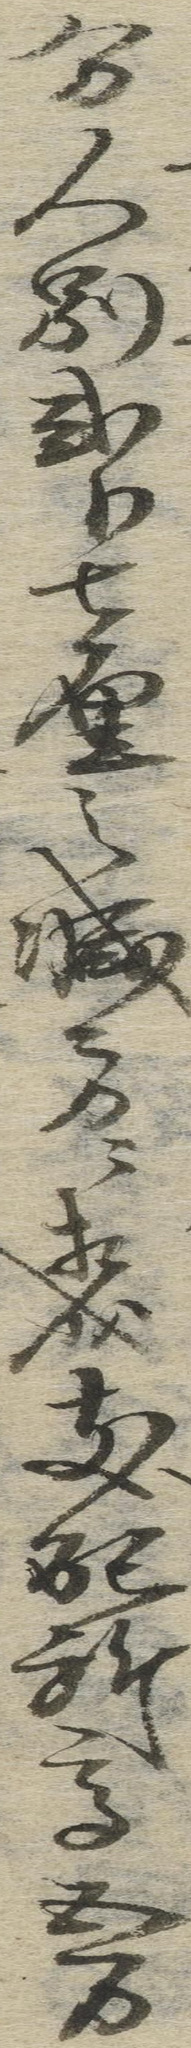分人別弐分七厘之減方二相成支配所高五万
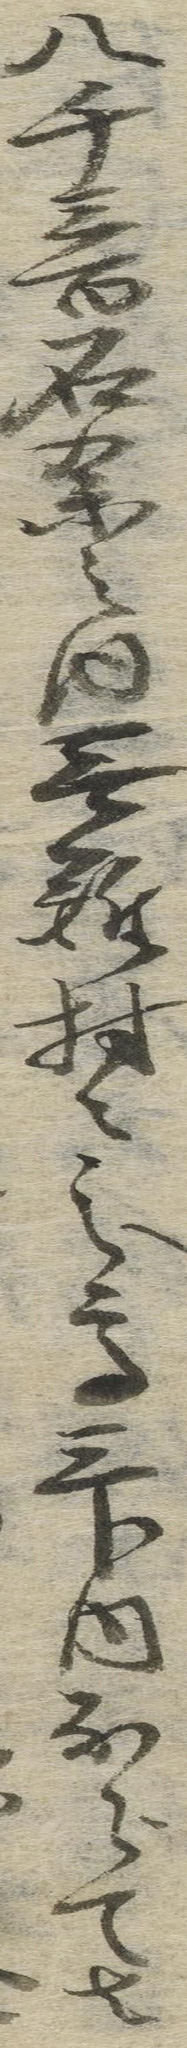八千三百石余之内無難村々之高三分内ならでは
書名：信濃越後　地震書留
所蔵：東京大学地震研究所図書室 Earthquake Research Institute Library, The University of Tokyo, JAPAN
